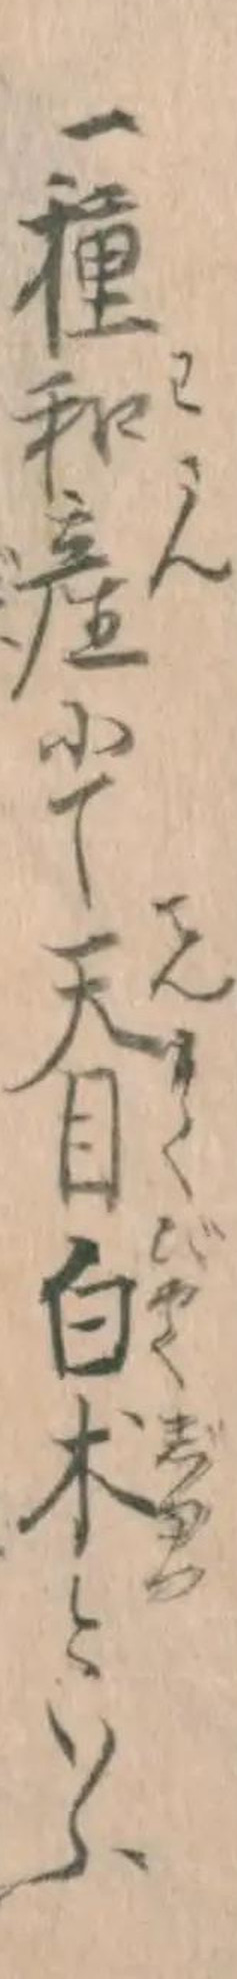一種和産にて天目白朮といふ
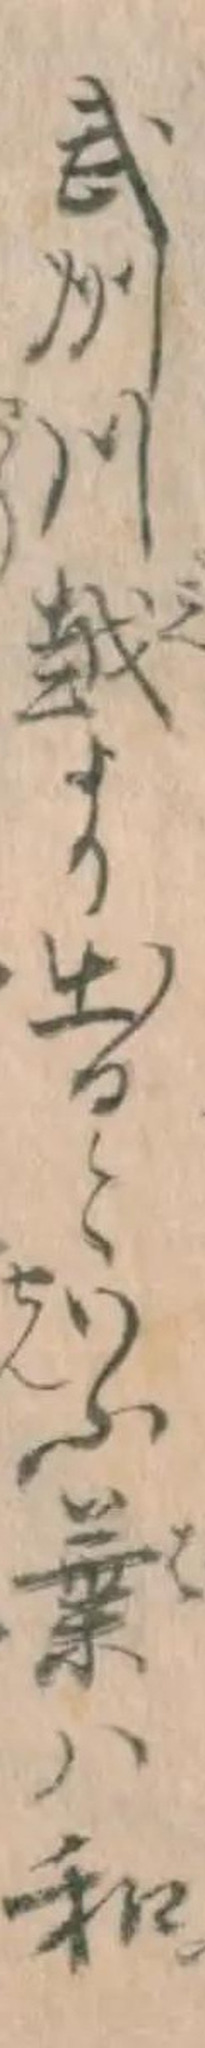武州川越より出るといふ葉は和
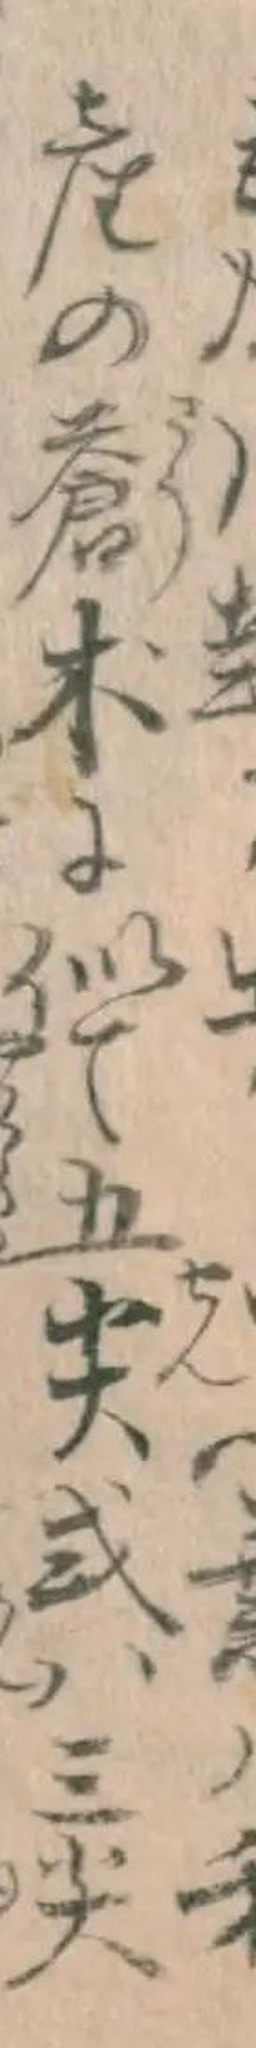産の蒼朮に似て五尖或は三尖
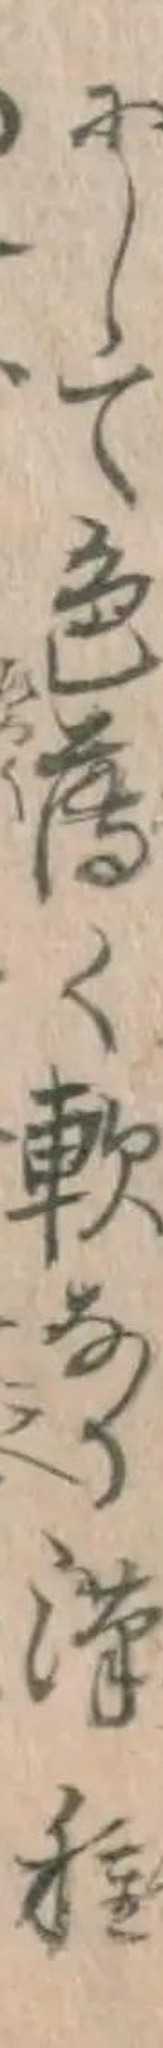にして色薄く軟なり漢種
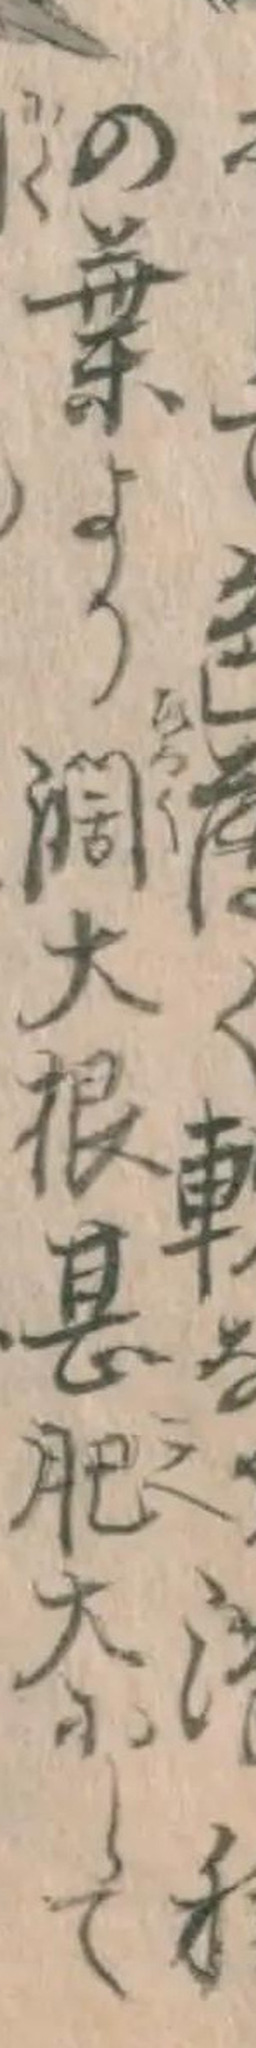の葉より濶大根甚肥大にして
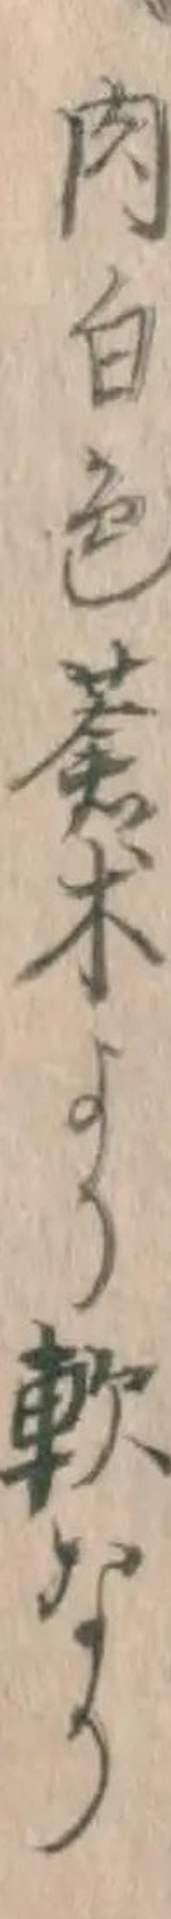肉白色蒼朮より軟なり

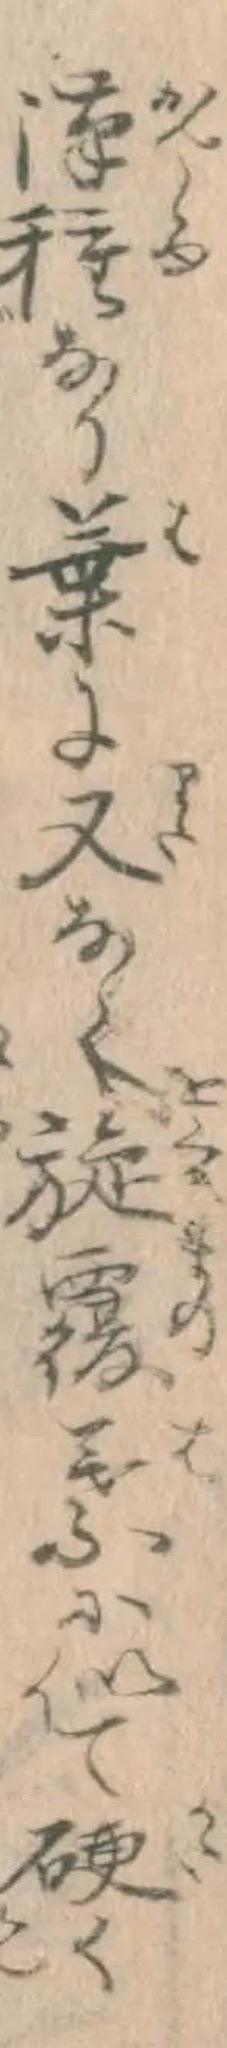蒼朮漢種なり葉に又なく旋覆葉に似て硬く
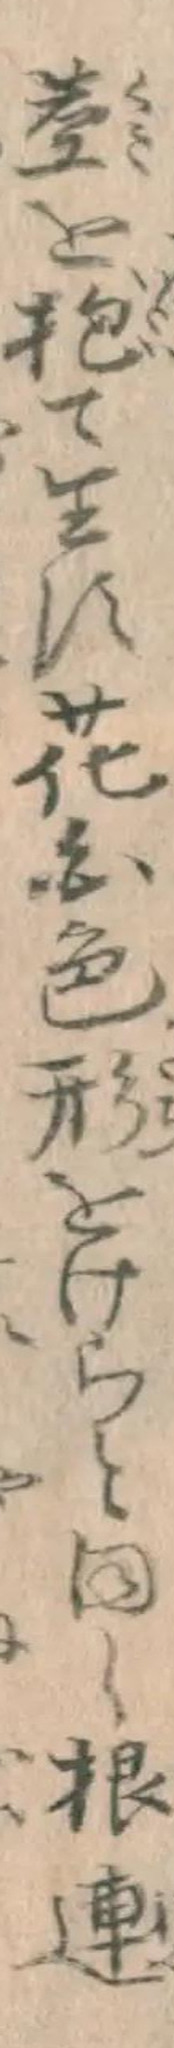茎を抱て生す花白色形をけらと同く根連
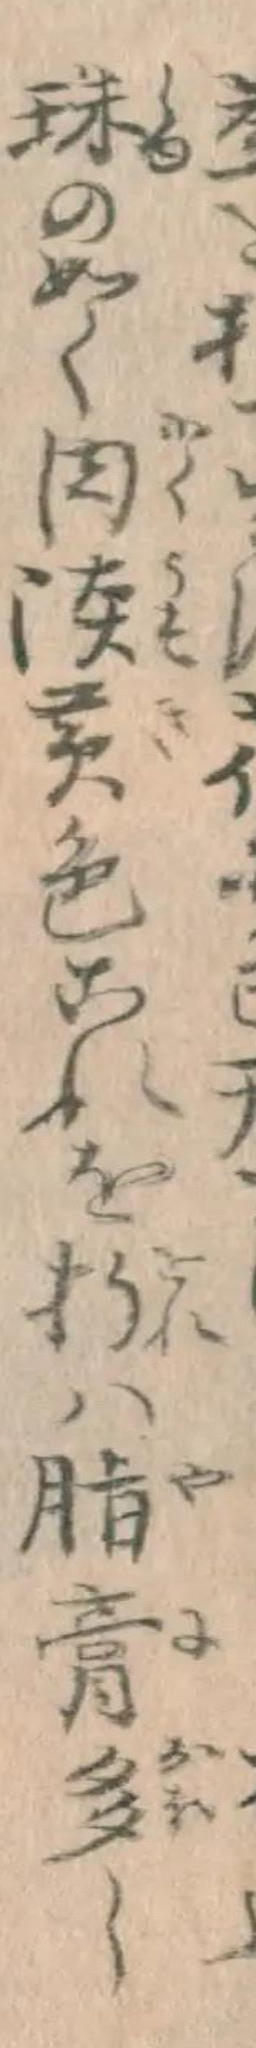珠の如く肉淡黄色これを折は脂膏多し
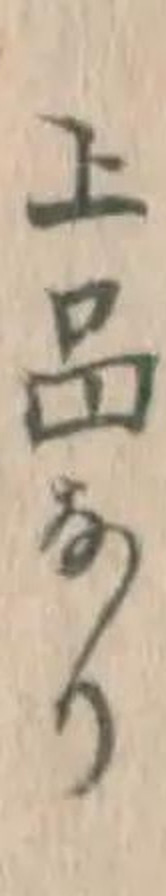上品なり
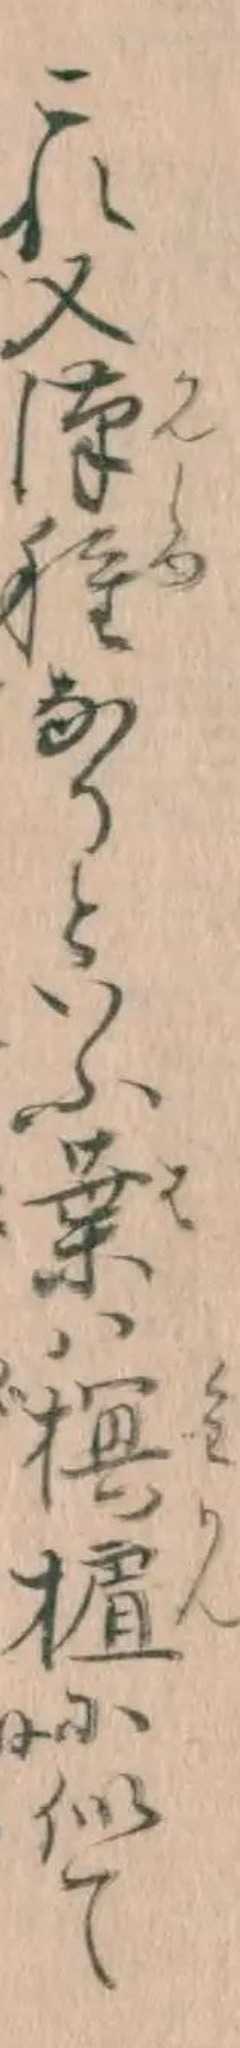一種これ又漢種なりといふ葉榠樝に似て
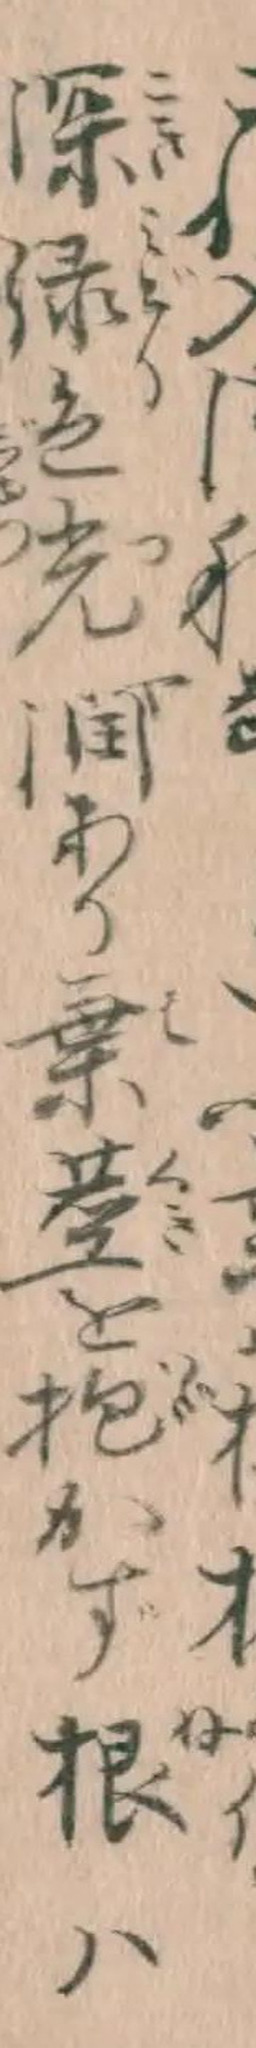深緑色光潤あり葉茎を抱かず根は
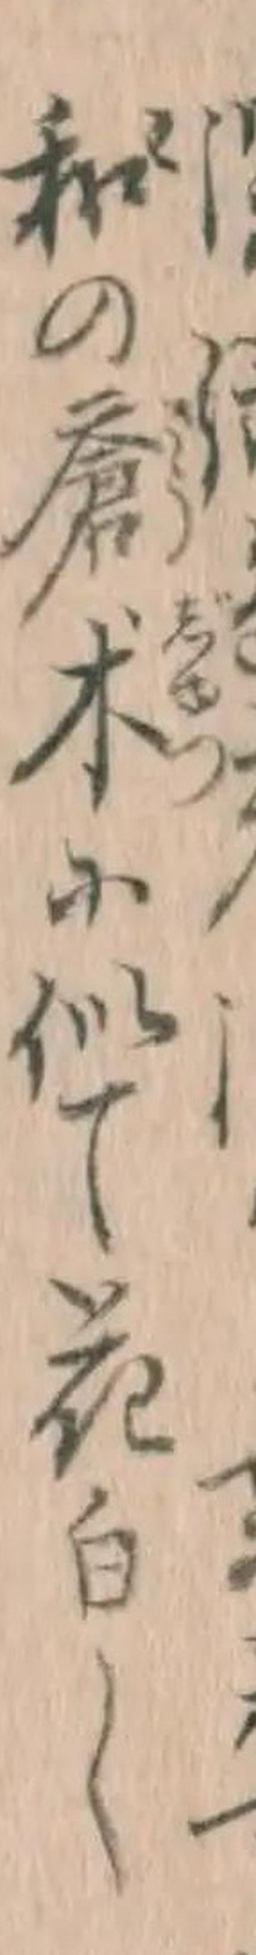和の蒼朮に似て花白し

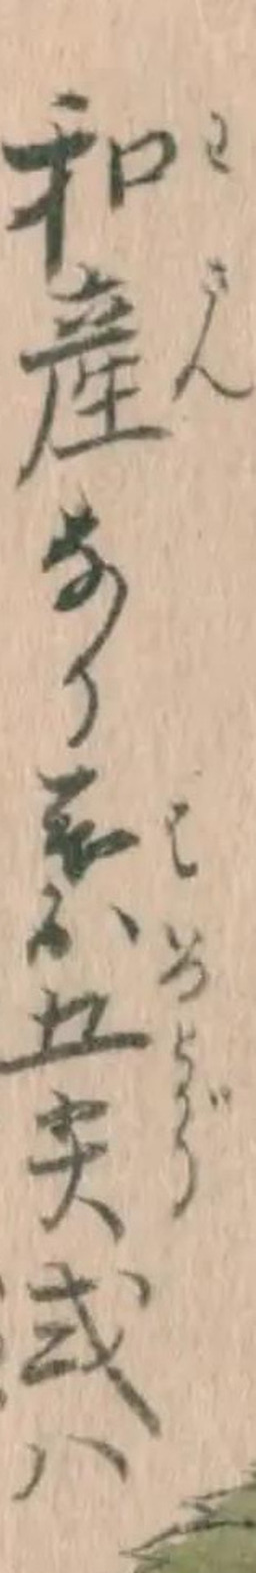和産なり葉五尖或は
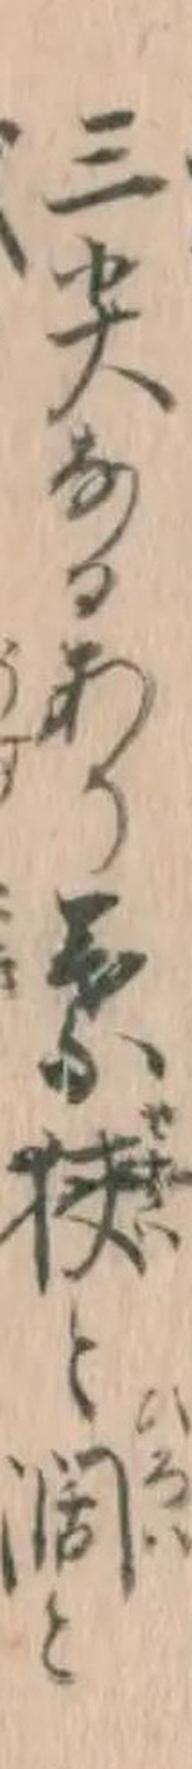三尖なるあり葉狭と濶と
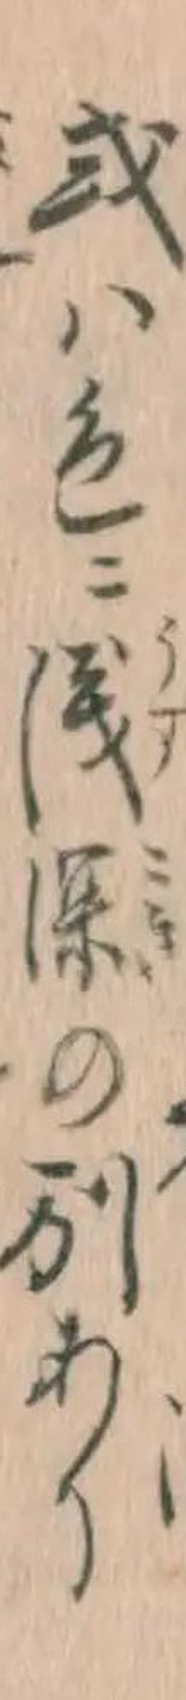或は色に浅濃の別あり
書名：本草図譜. 巻5-6
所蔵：国立国会図書館 National Diet Library, JAPAN
